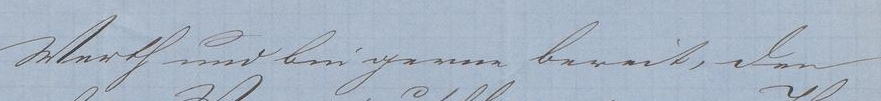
Werth und bin gerne bereit, den
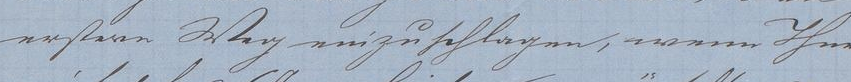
erstern Weg einzuschlagen, wenn Ihnen
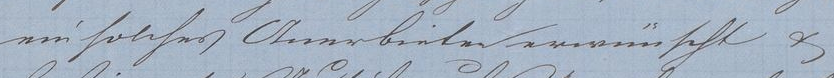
ein solches Anerbieten erwünscht &
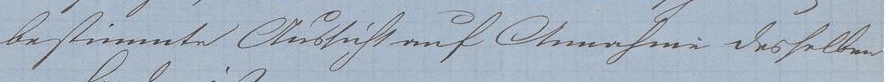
bestimmte Aussicht auf Annahme desselben
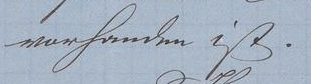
vorhanden ist.
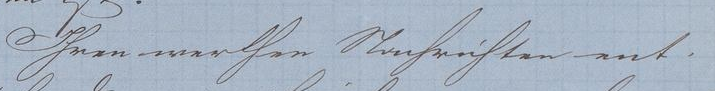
Ihren werthen Nachrichten ent-
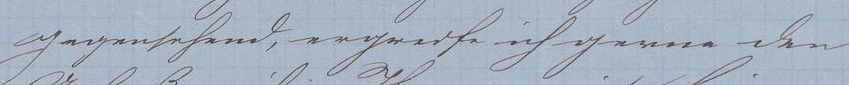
gegensehend, ergreife ich gerne den
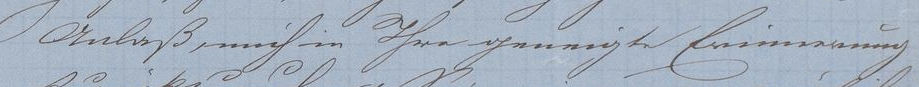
Anlaß, mich in Ihre geneigte Erinnerung
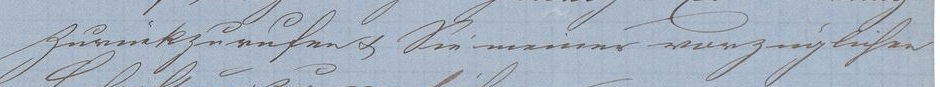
zurückzurufen & Sie meiner vorzüglichen
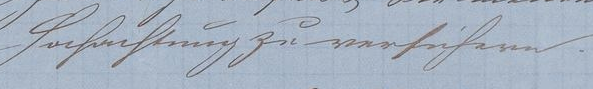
Hochachtung zu versichern.
